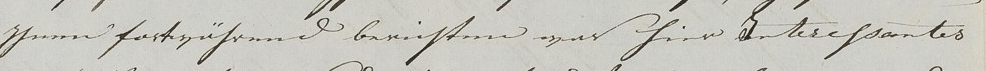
Ihnen fortwährend berichten was hier Interessantes
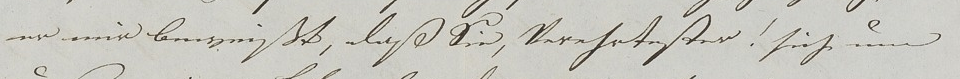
es mir beweißt, daß Sie, Verehrtester! sich um
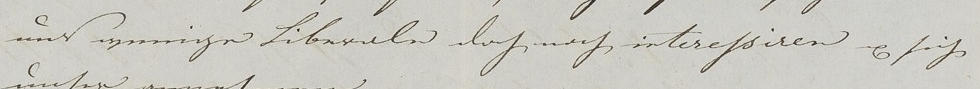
uns wenige Liberale doch noch interessiren & sich
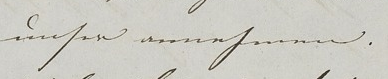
unser annehmen.
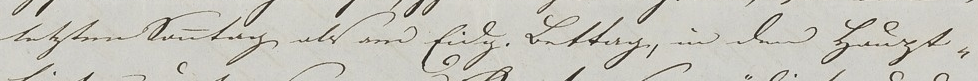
letzten Sonntag, als am Eidg. Bettag, in den Haupt-
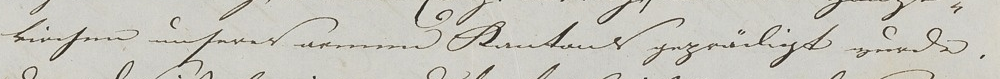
kirchen unseres armen Kantons geprädigt wurde.
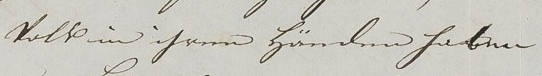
Volk in ihren Händen haben
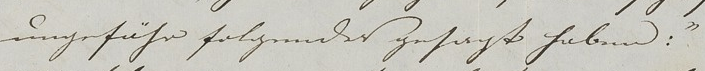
ungefähr folgendes gesagt haben: «
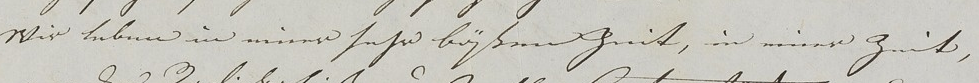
Wir leben in einer sehr bößen Zeit, in einer Zeit,
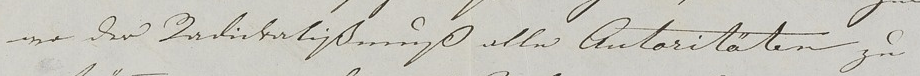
wo der Radickalißmuß alle Autoritäten zu
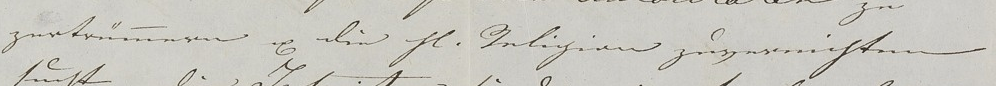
zertrümmern & die hl. Religion zuvernichten
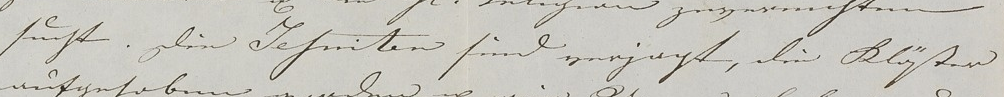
sucht. Die Jesuiten sind verjagt, die Klöster
